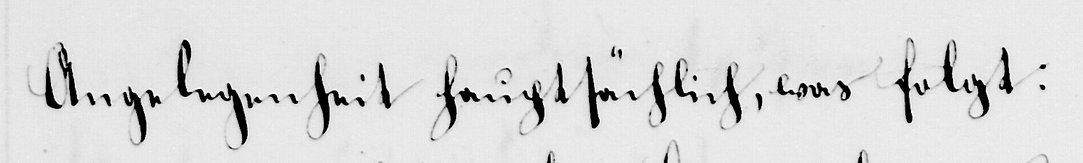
Angelegenheit hauptsächlich, was folgt:
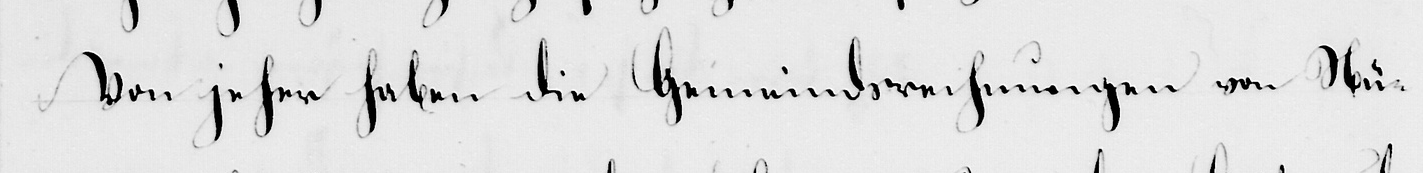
Von jeher haben die Gemeindsrechnungen von Nü¬
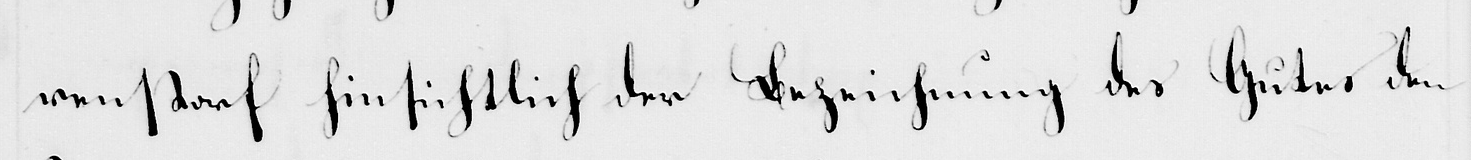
renstorf hinsichtlich der Bezeichnung des Gutes den
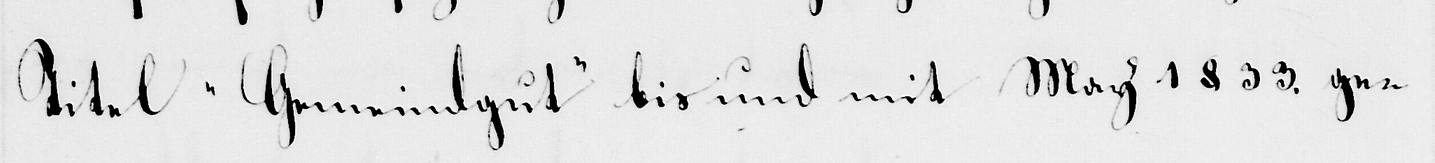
Titel „Gemeindgut“ bis und mit May 1833. ge¬
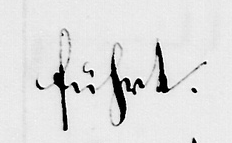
führt.
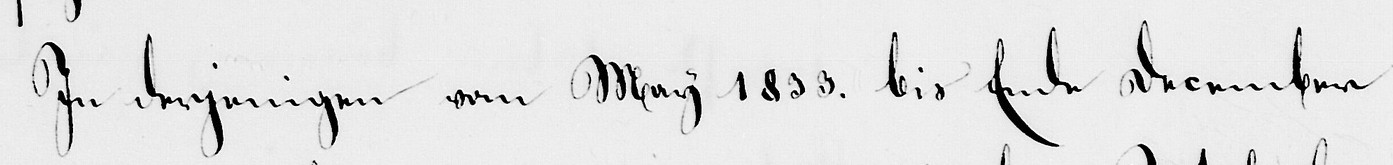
In derjenigen vom May 1833. bis Ende December
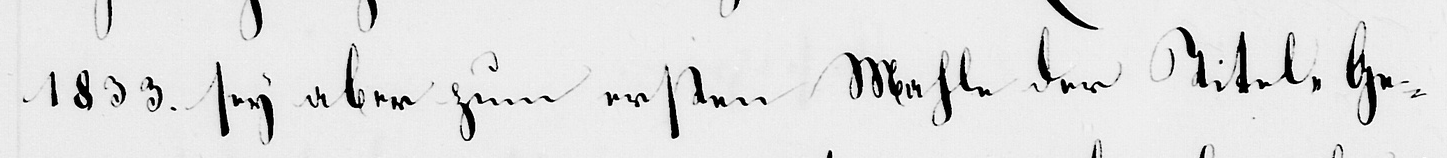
1833. sey aber zum ersten Mahle der Titel „Ge¬
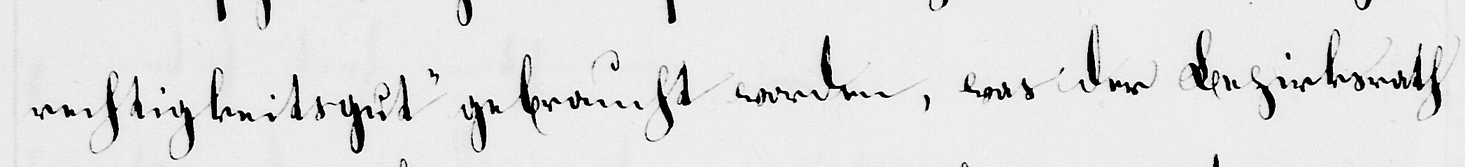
rechtigkeitsgut“ gebraucht worden, was der Bezirksrath
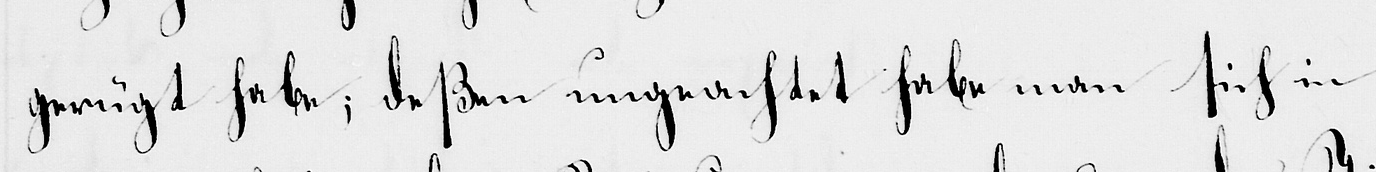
gerügt habe; deßen ungeachtet habe man sich in
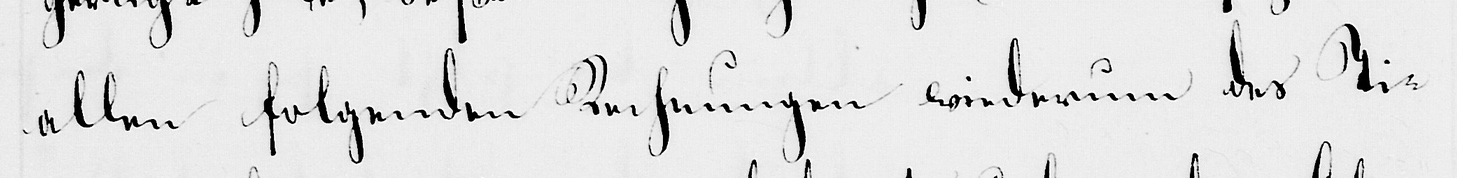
allen folgenden Rechnungen wiederum des Ti¬
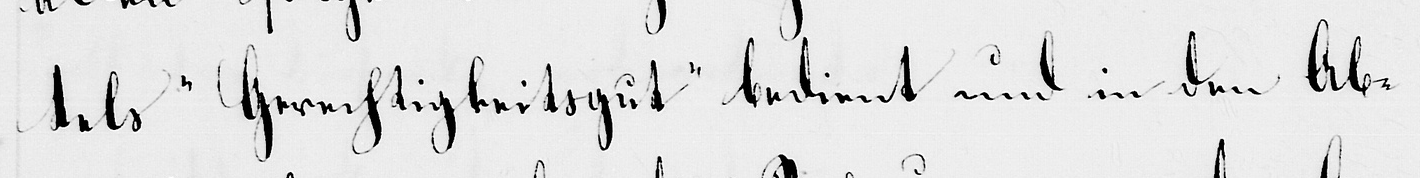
tels „Gerechtigkeitsgut“ bedient und in den Ab¬
